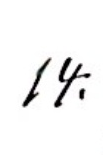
14.
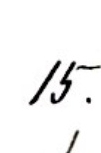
15.
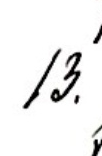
13.
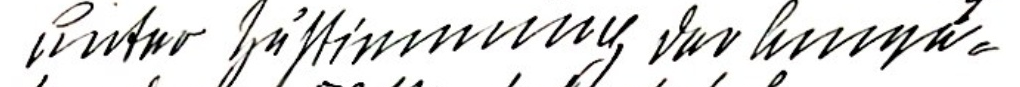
unter Zustimmung der Anwe
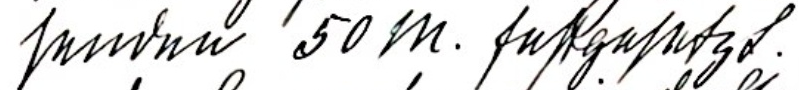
senden 50 M festgesetzt.
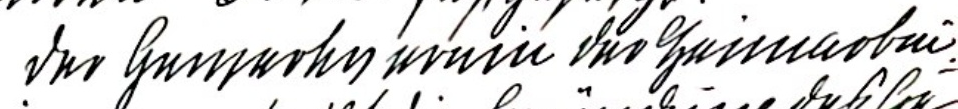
Der Gewerksverein der Heimarbei
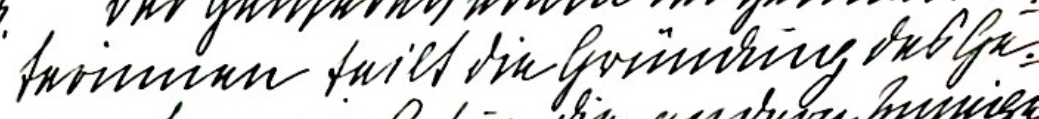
terinnen teil die Gründing des Ge-
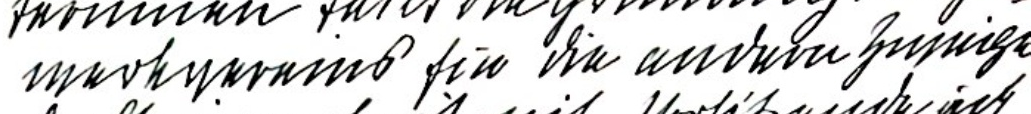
werkvereins für die anderen Zweige
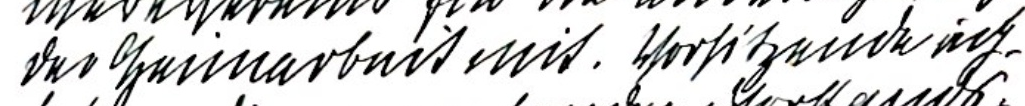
der Heimarbeit mit. Vorsitzende rich
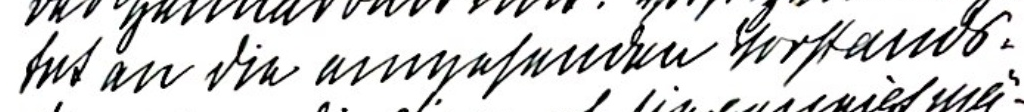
tet an die anwesenden Vorstands
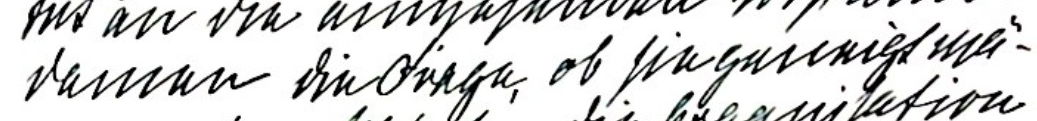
damen die Frage, ob sie geneigt wä
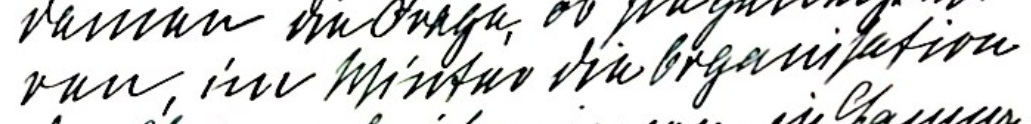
ren im Winter die Organisation
